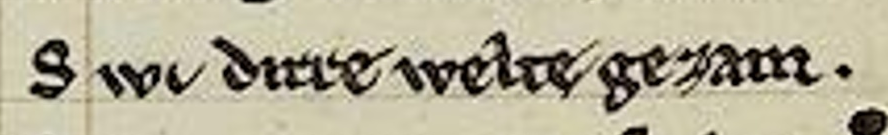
Sw(az) dirre welte gezam.
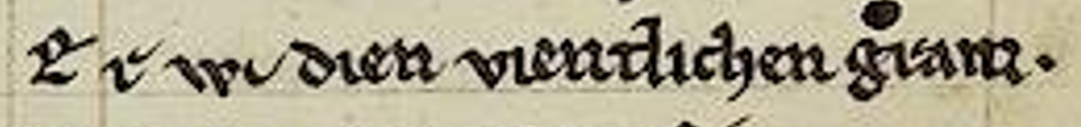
Er w(az) dien vientlichen gram.
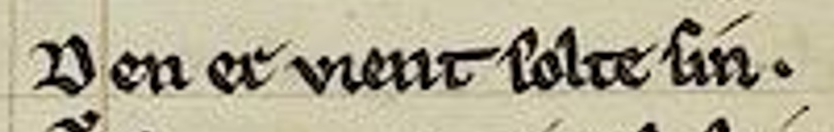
Den er vient ſolte ſin.
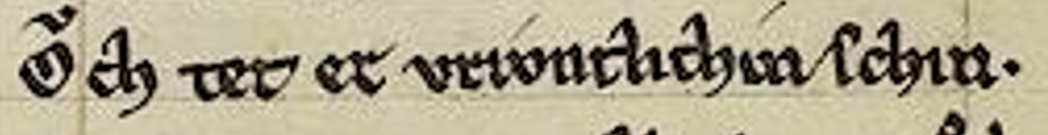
O°vch tet er vrivntlichin ſchin.
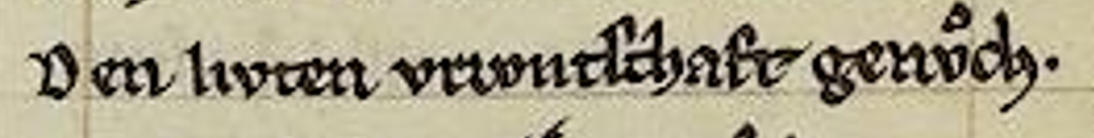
Den livten vrivntſchaft genv°och.
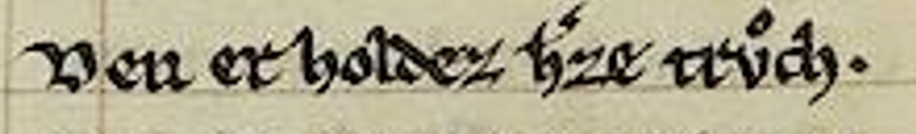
Den er holdez h(er)ze trv°och.
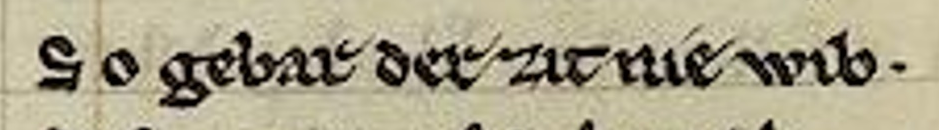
So gebar der zit nie wib.
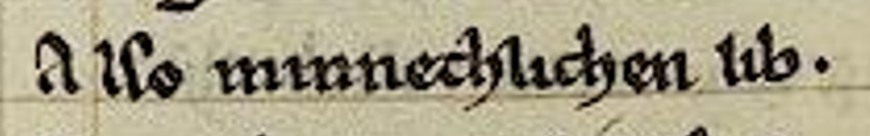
Alſo minnechlichen lib.
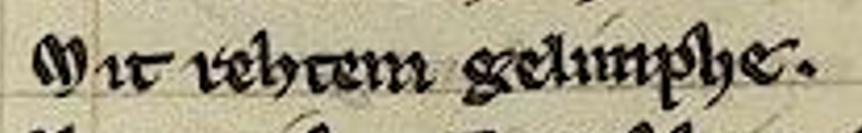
Mit rehtem gelimphe.
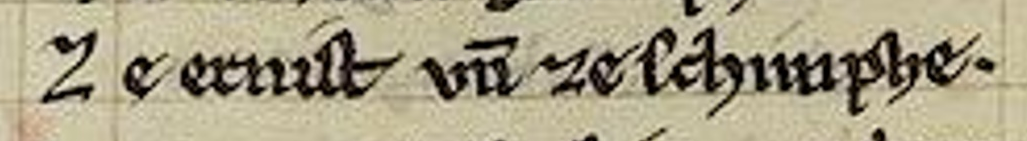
Ze erniſt vn(d) ze ſchimphe.
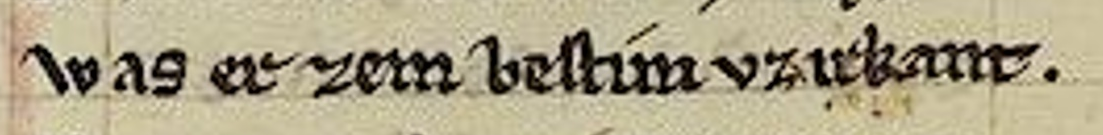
Was er zem beſtim vz irkant.
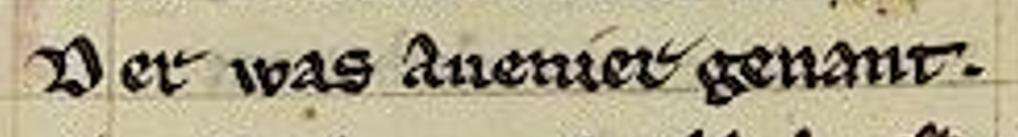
Der was Auenier genant.
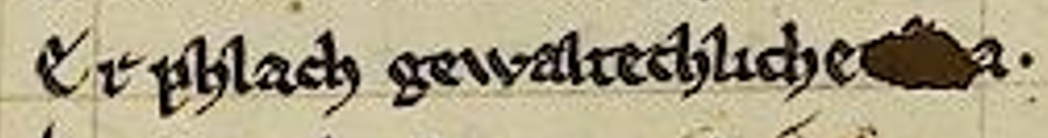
Er phlach gewaltechliche da.
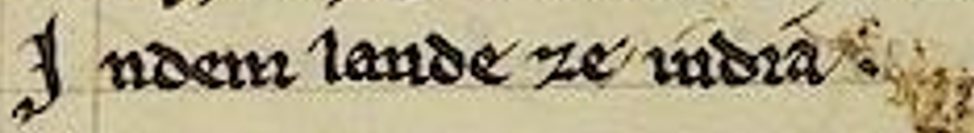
Indem lande ze india.
